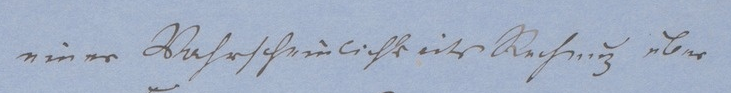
einer Wahrscheinlichkeits Rechnung über
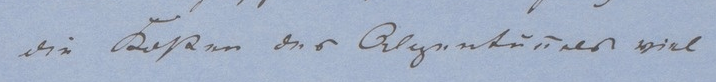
die Kosten des Alpentunnels viel
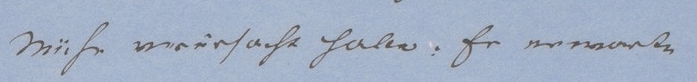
Mühe verursacht habe: Er erwarte
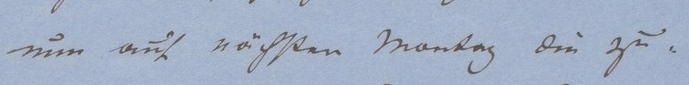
nun auf nächsten Montag die zu-
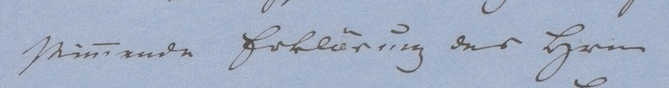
stimmende Erklärung des Herrn
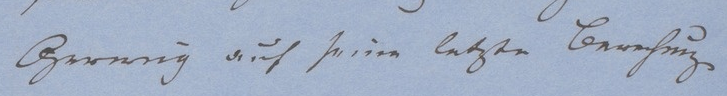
Gerwig auf seine letzte Berechnung.
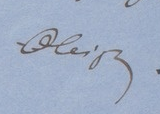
Obiger.
